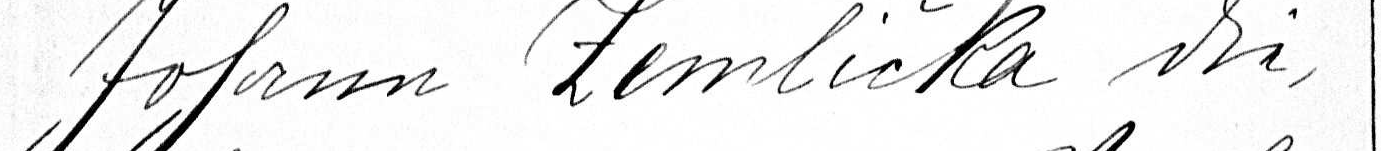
Johann Žemlička die,
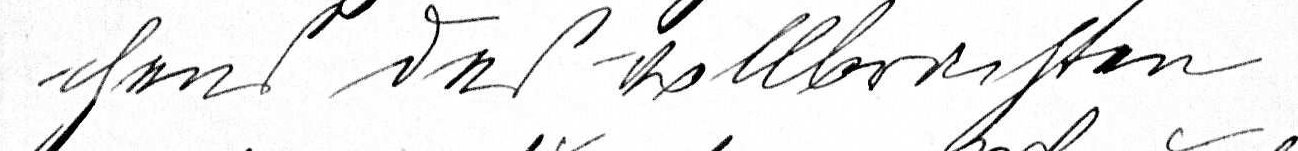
chens des vollbrachten
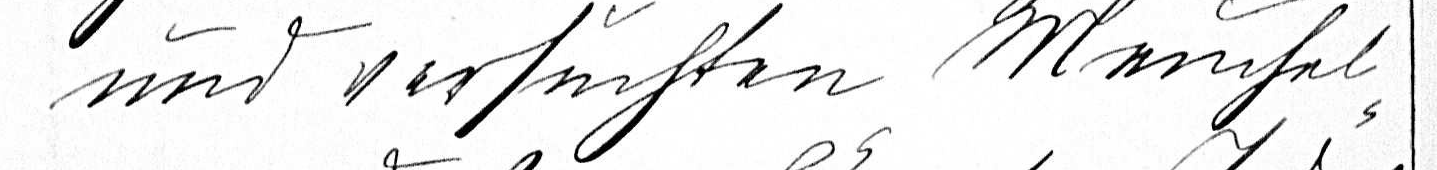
und versuchten Meuchel¬
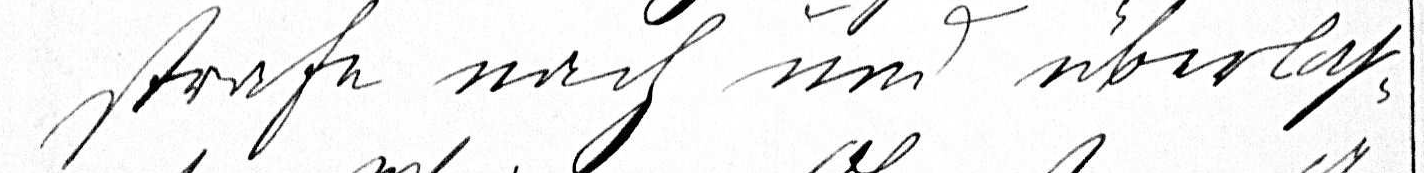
strafe nach und überlas¬
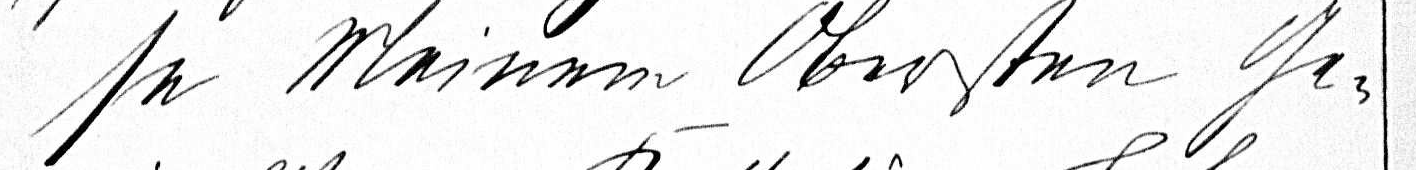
se Meinem Obersten Ge¬
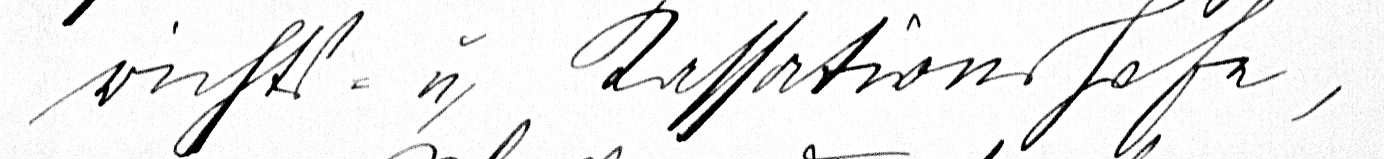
richts= u/ Kassationshofe,
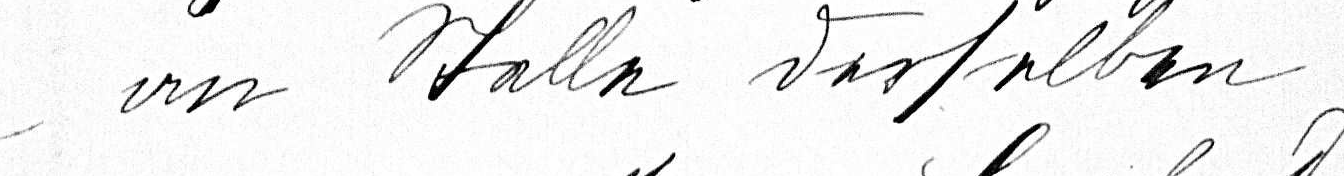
an Stelle derselben
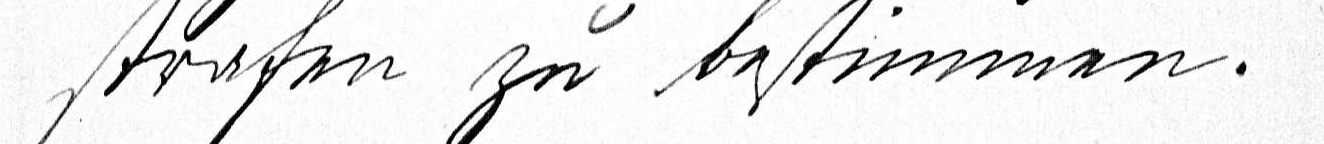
strafen zu bestimmen.
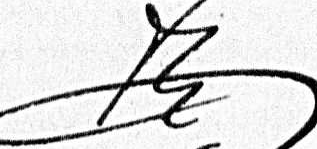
xx
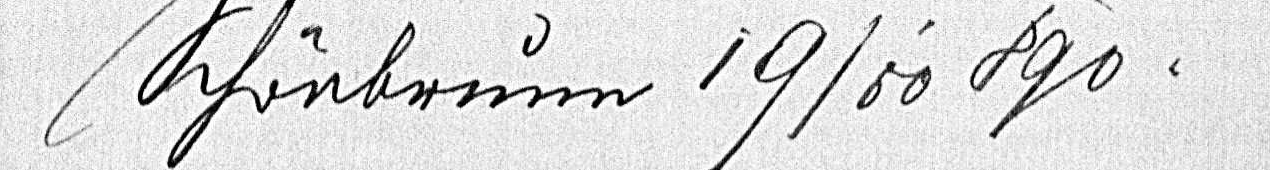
Schönbrunn 19/10 890.
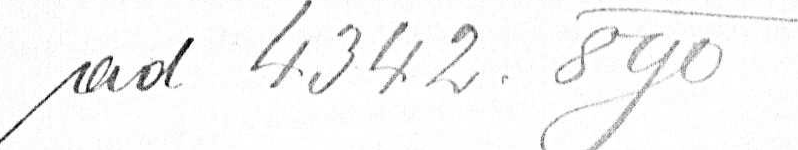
ad 4342. 890
